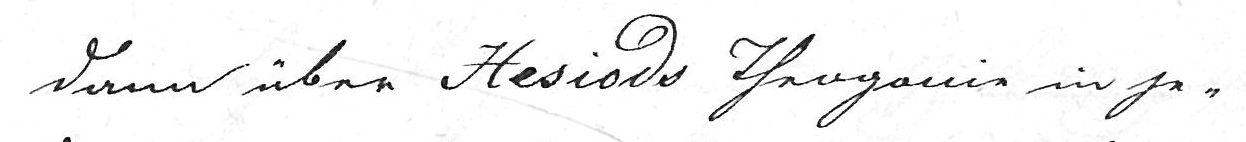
dann über Hesiods Theogonie in je-
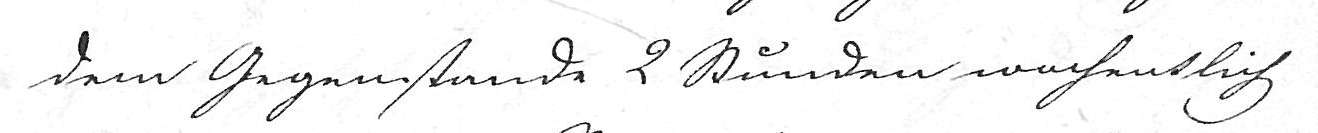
dem Gegenstande 2 Stunden wochentlich
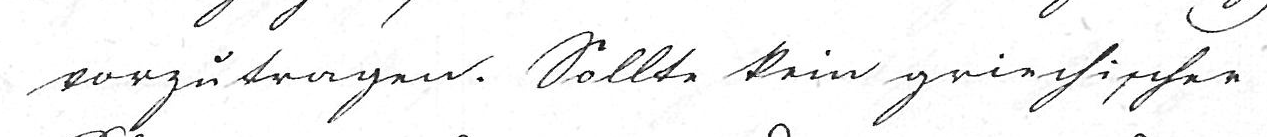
vorzutragen. Sollte kein griechischer
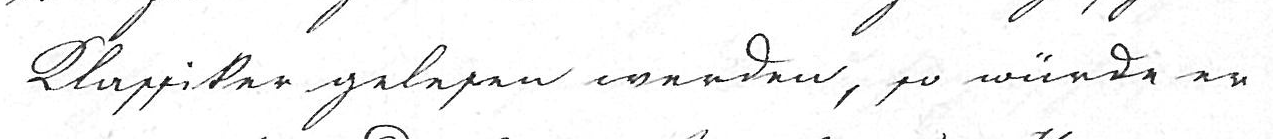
Klassiker gelesen werden, so würde er
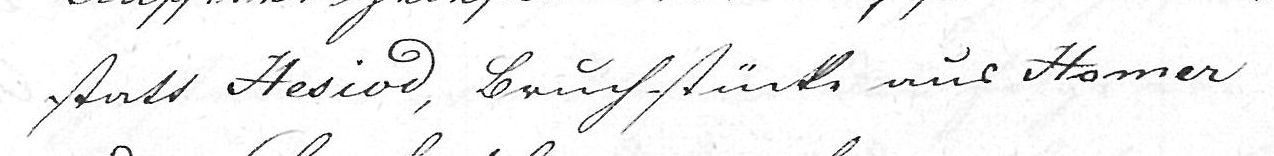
statt Hesiod, Bruchstücke aus Homer
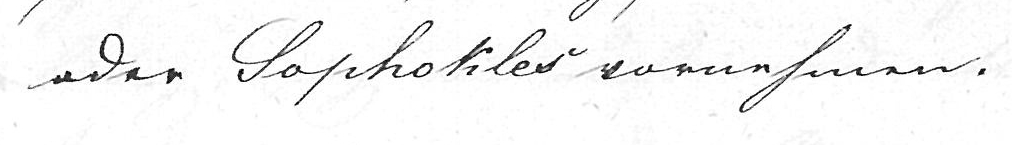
oder Sophokles vornehmen.
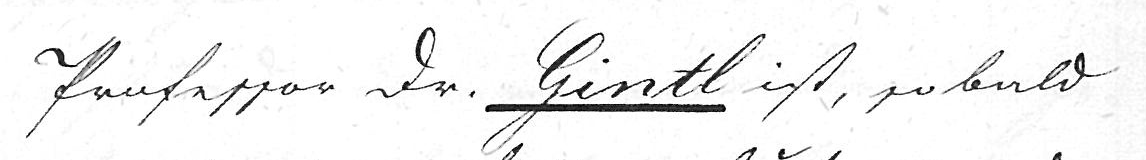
Professor Dr. Gintl ist, sobald
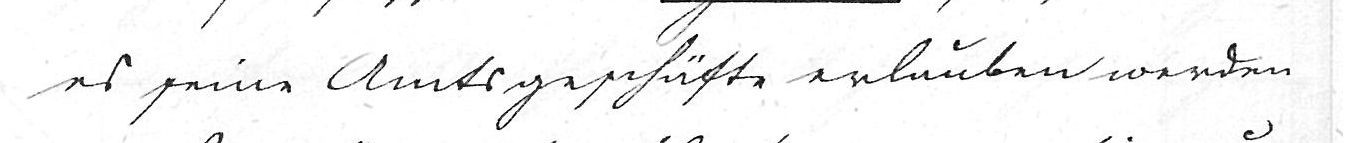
es seine Amtsgeschäfte erlauben werden
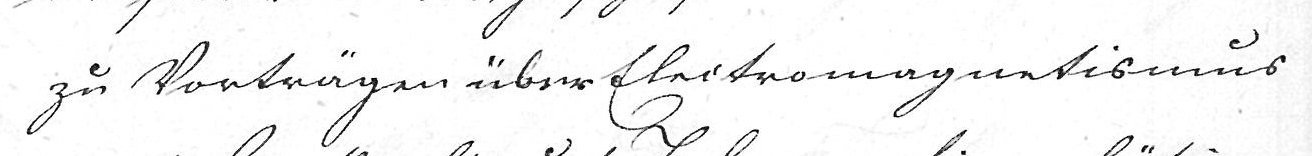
zu Vorträgen über Electromagnetismus
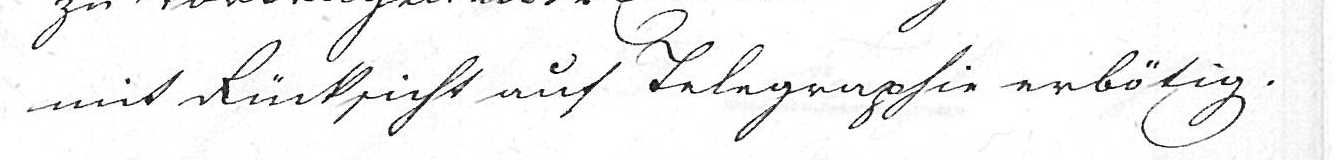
mit Rücksicht auf Telegraphie erbötig.
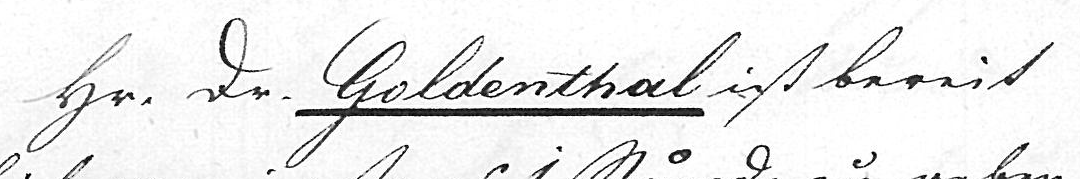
Hr. Dr. Goldenthal ist bereit
